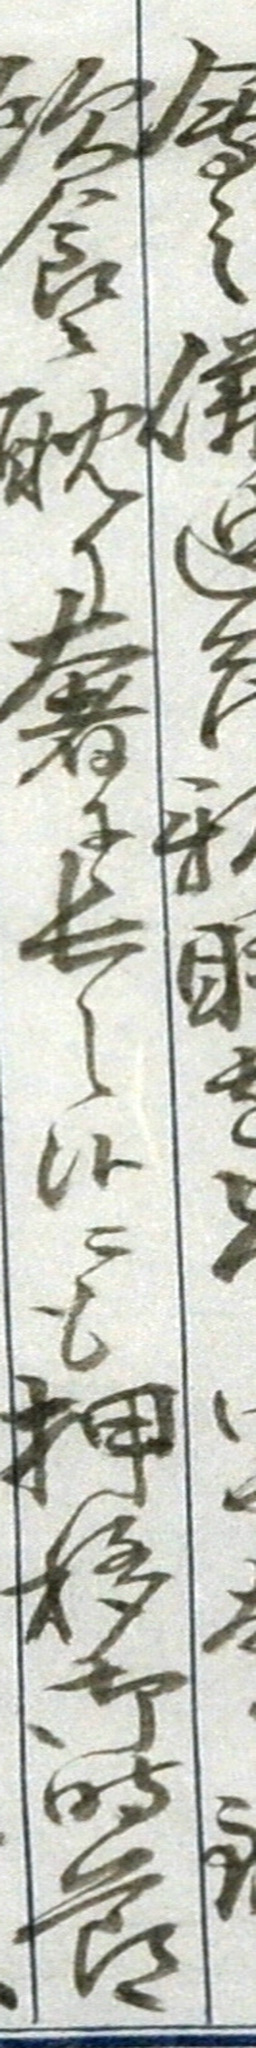飲食ニ耽り奢に長し候ニも押移御時節
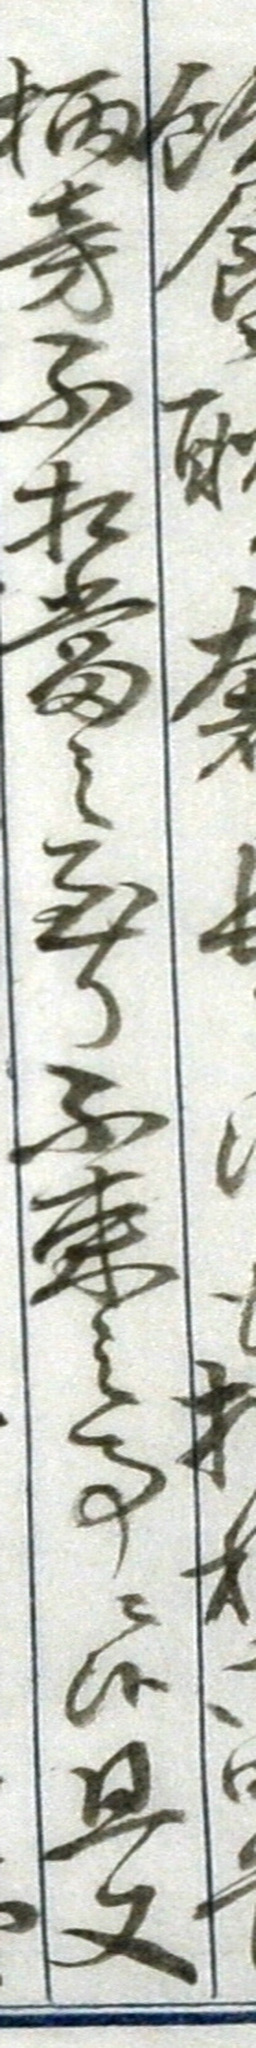柄旁不相当之至り不束之事ニ候且又
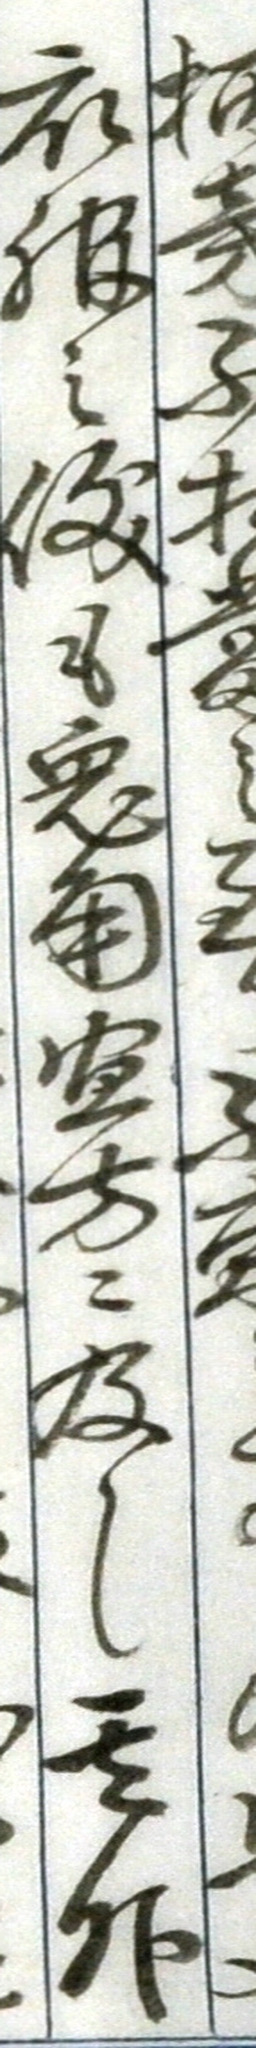衣服之儀も兎角宜方ニ及し其外
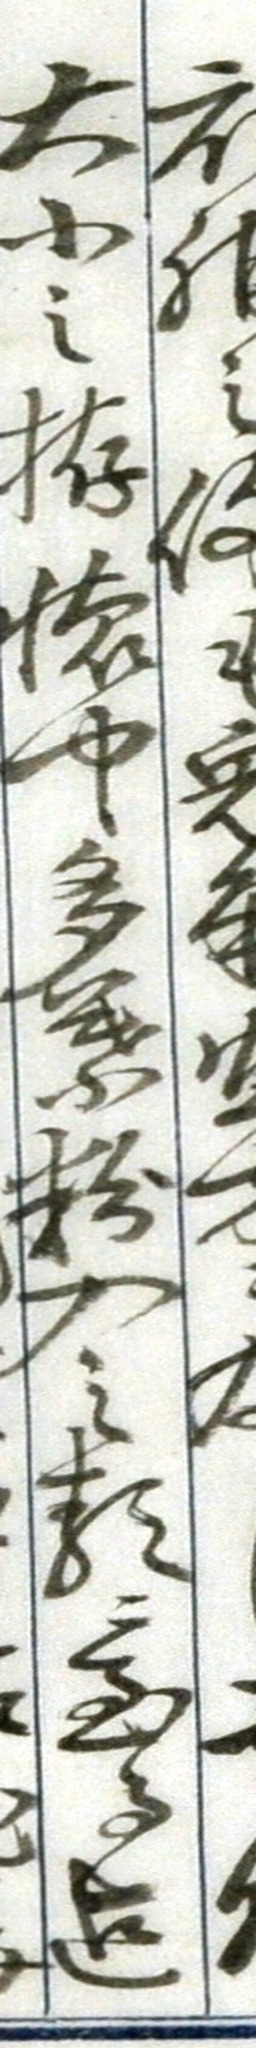大小之拵懐中多葉粉入之類ニ至る迄
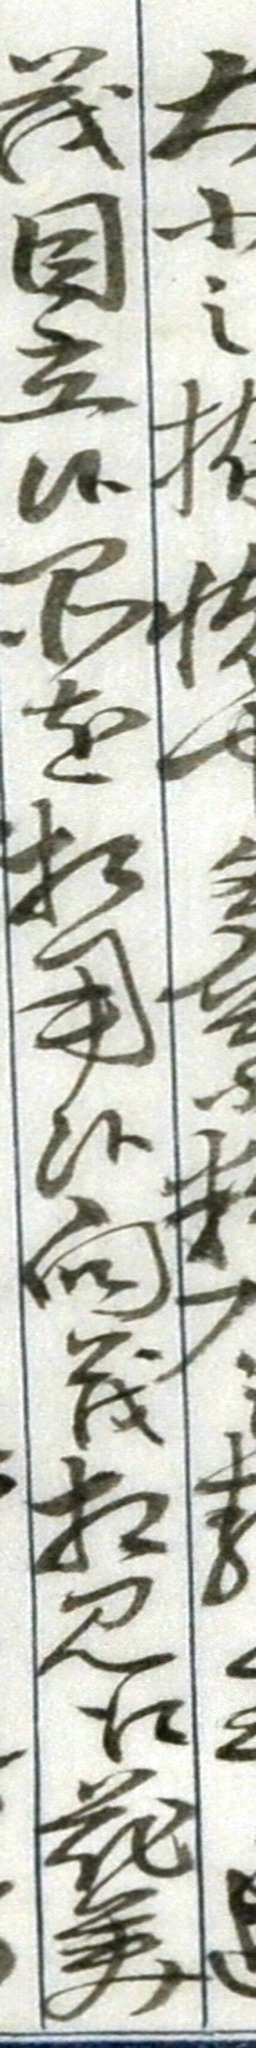も目立候品を相用候向も相見江花美
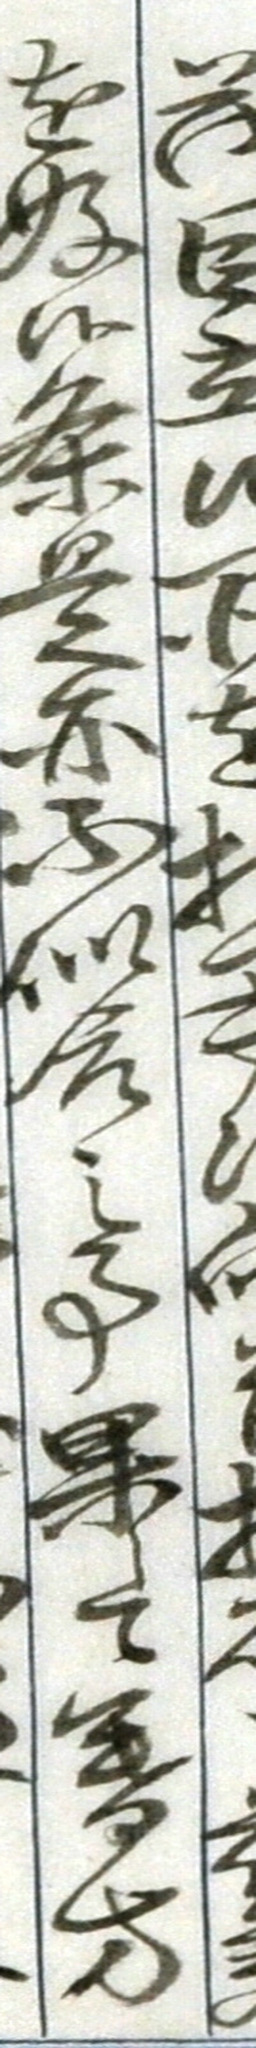を好候条是亦不似合之事果して暮方
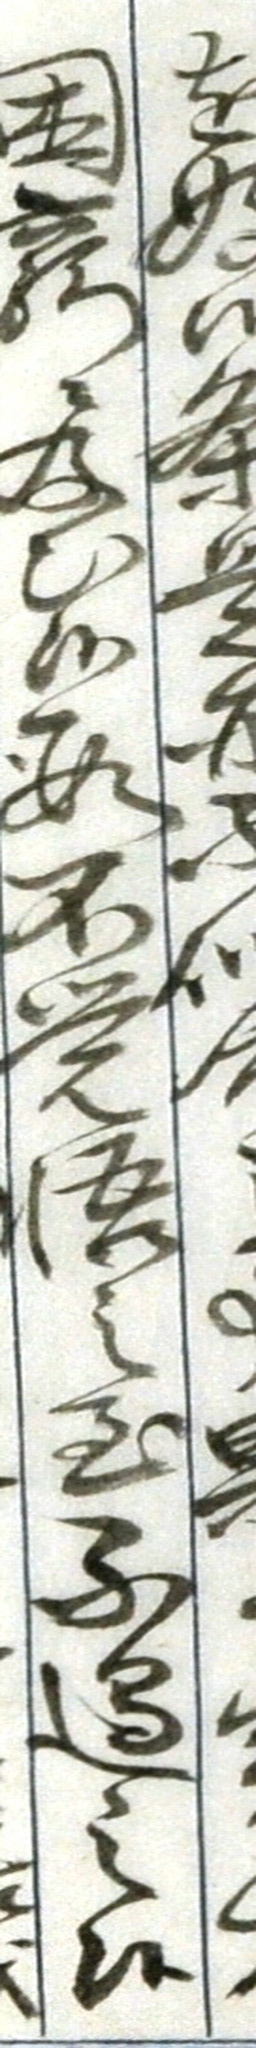困窮ニ及ひ候段不覚悟之至不過之候
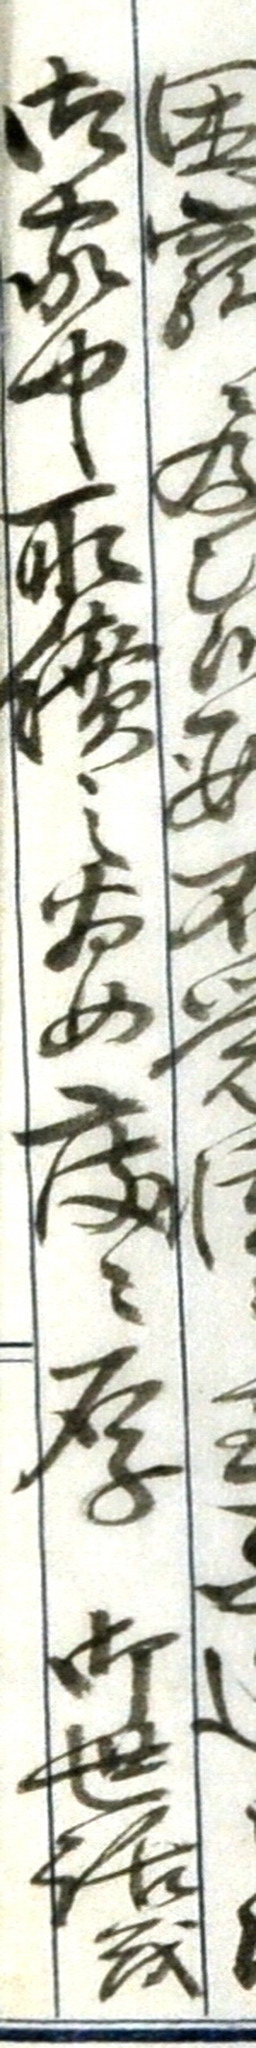御家中取続之為め度々厚御世話も

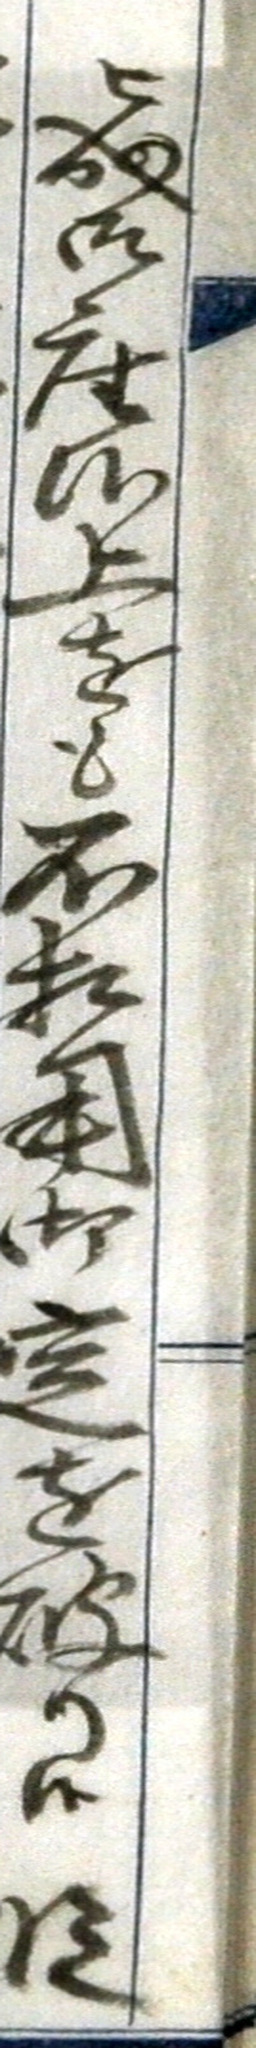被成御座候上をも不相用御定を破り候段
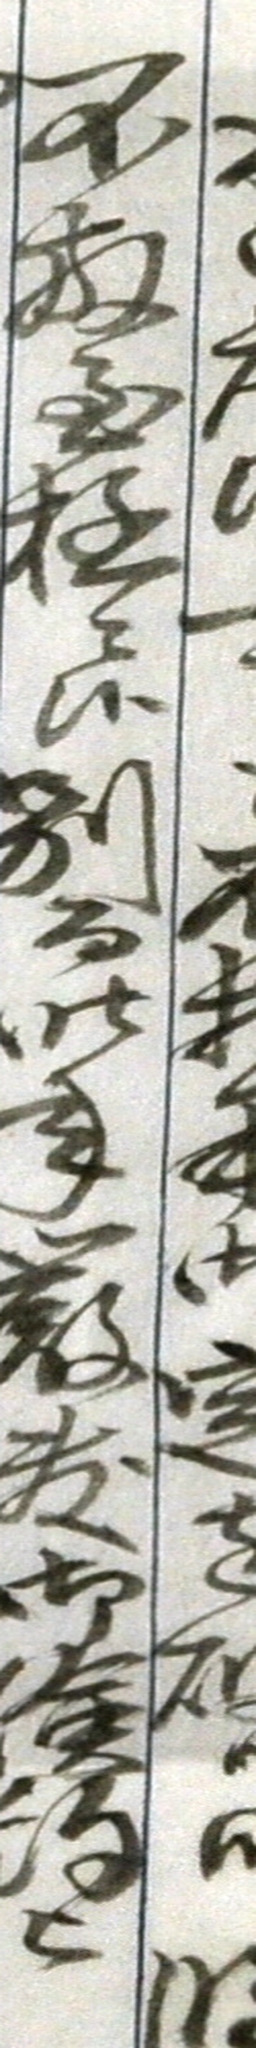不敬至極ニ候別而昨年厳敷御倹約被
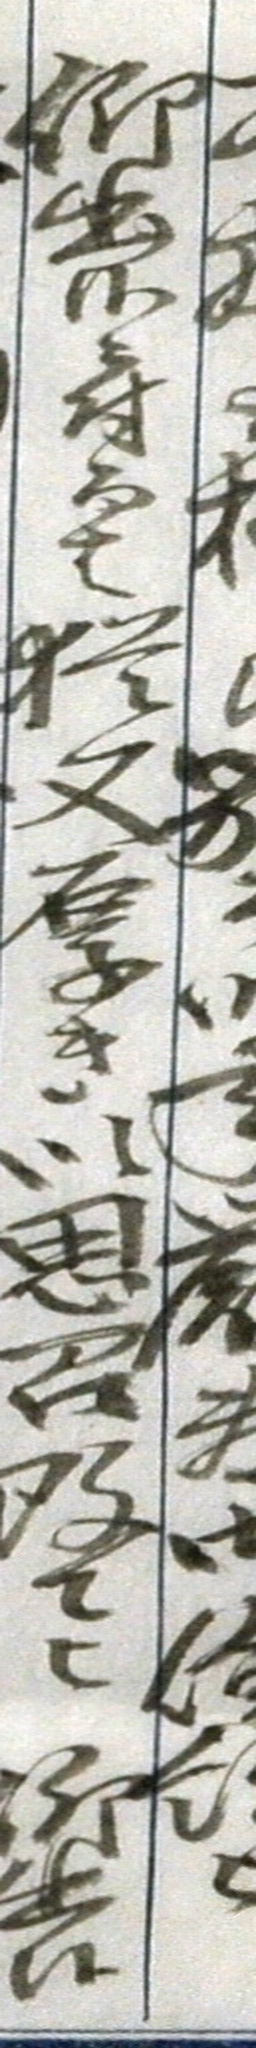仰出候ニ付而は猶又厚き以思召改て被仰出候
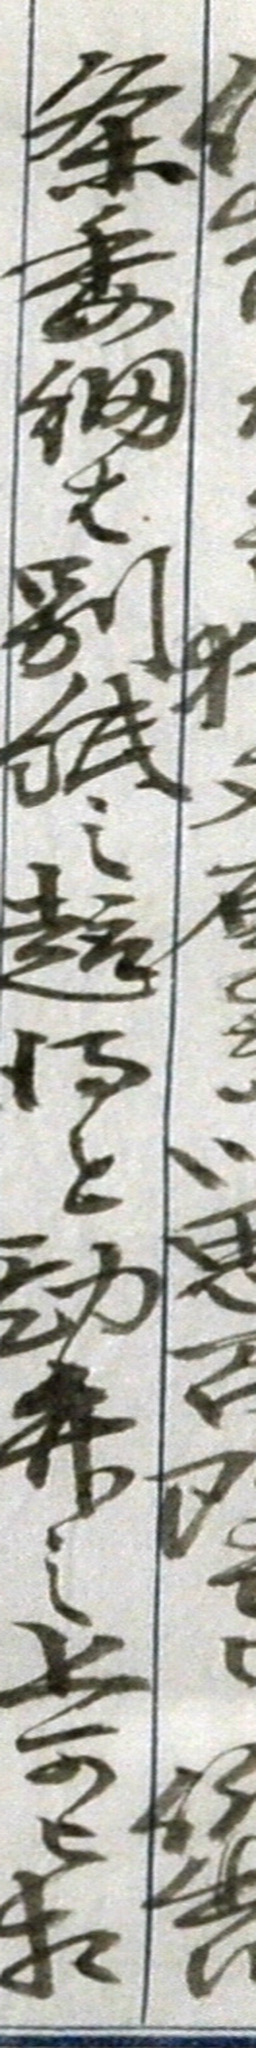条委細は別紙之趣得と勘弁之上可被相
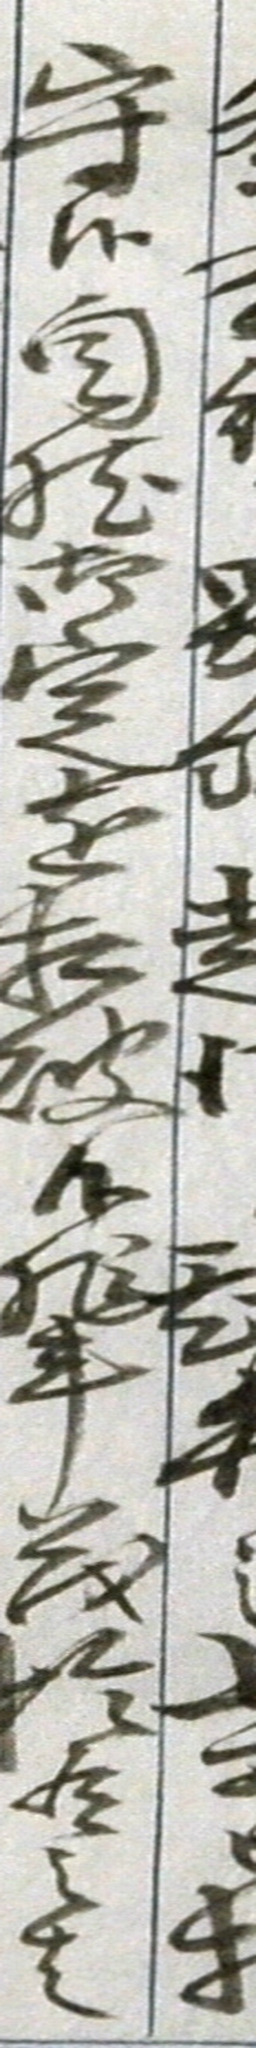守候自然御定を相破候輩も於有之は
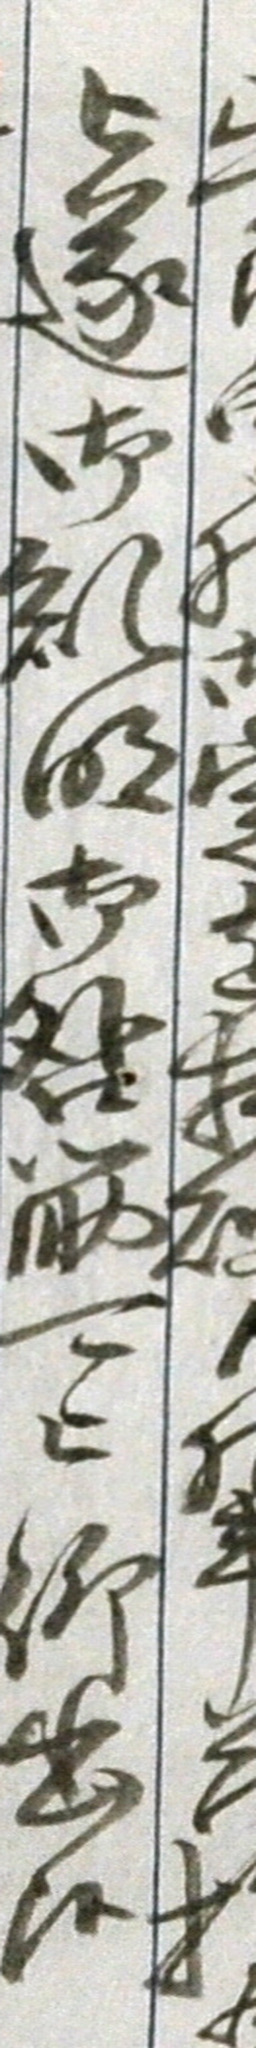被遂御糺明御咎筋可被仰出候
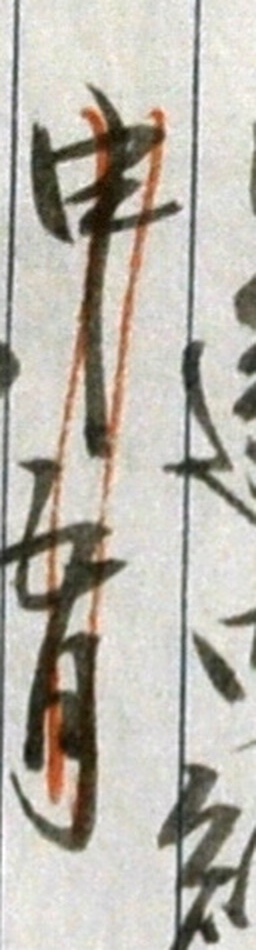申五月
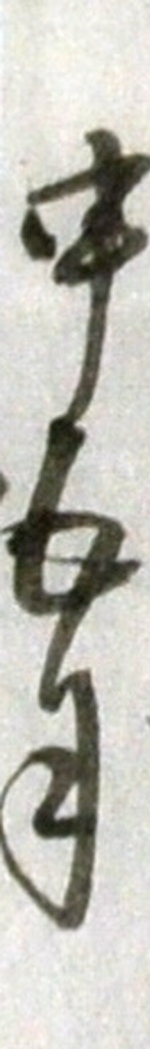申五月
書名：御倹約被仰出書
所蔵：伊那市立高遠町図書館・合同会社AMANE
